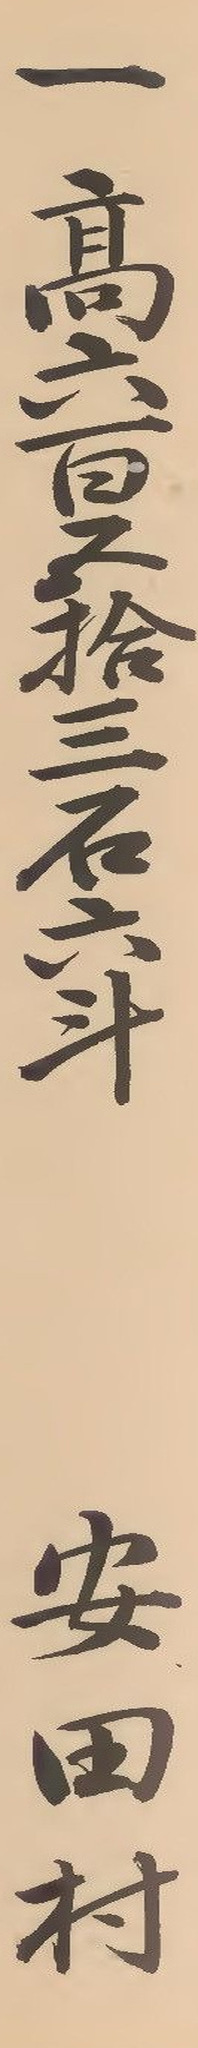一高六百五拾三石六斗安田村
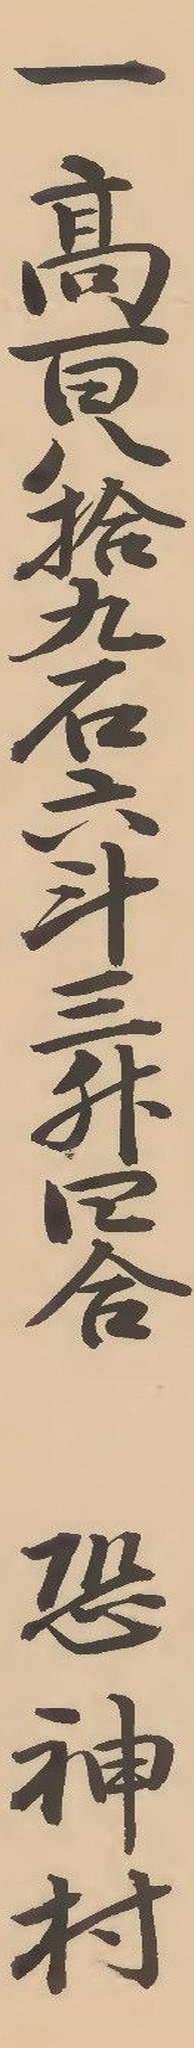一高百八拾九石六斗三升四合恐神村
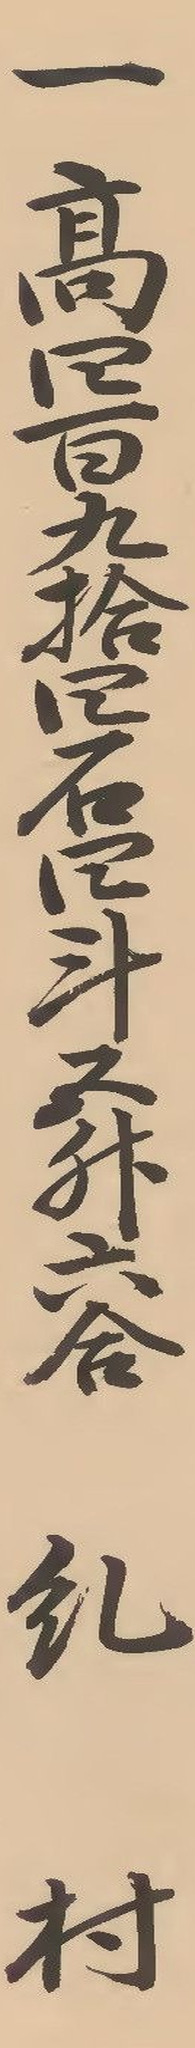一高四百九拾四石四斗五升六合糺村
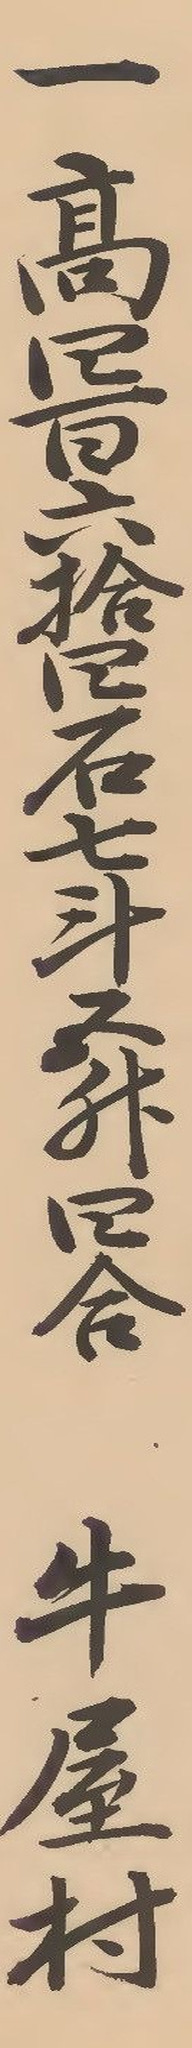一高四百六拾四石七斗五升四合牛屋村

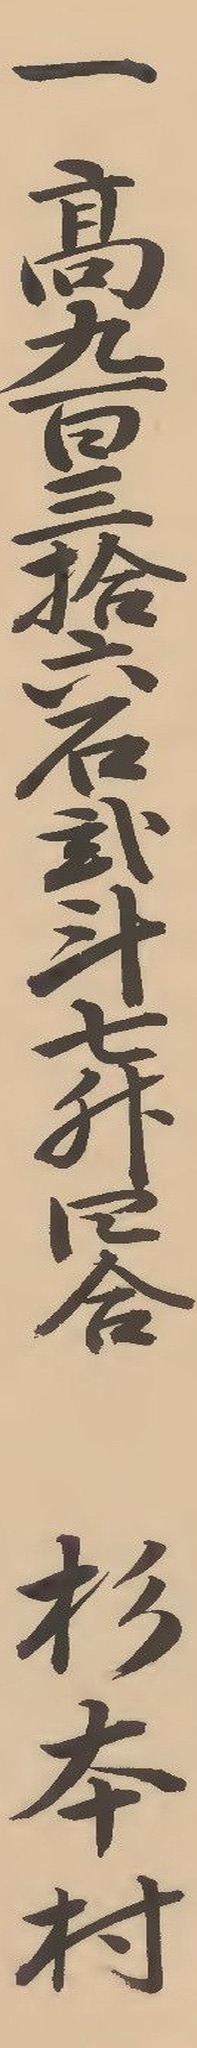一高九百三拾六石弐斗七升四合杉本村
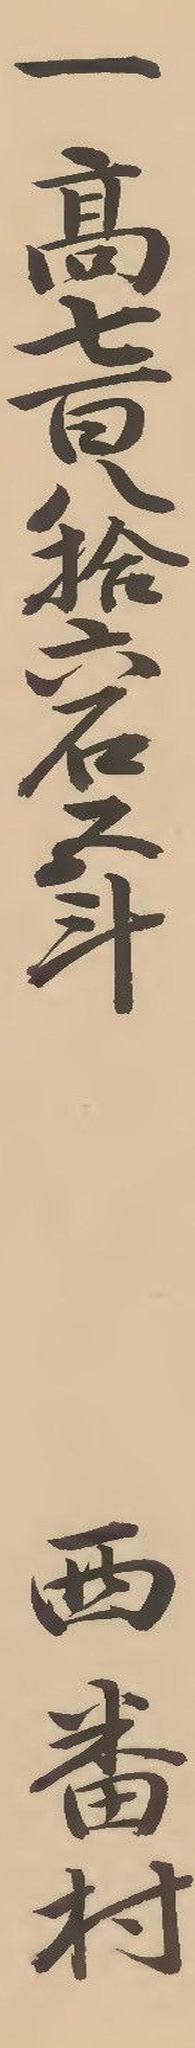一高七百八拾六石五斗西番村
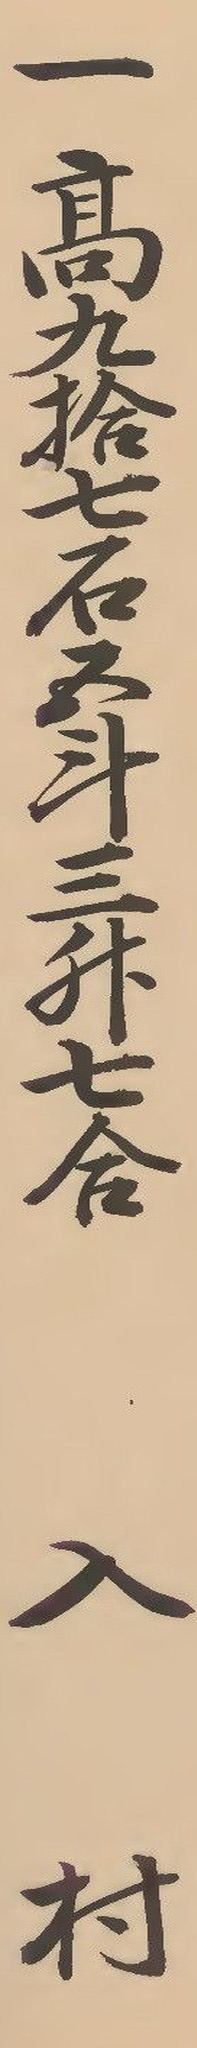一高九拾七石五斗三升七合入村
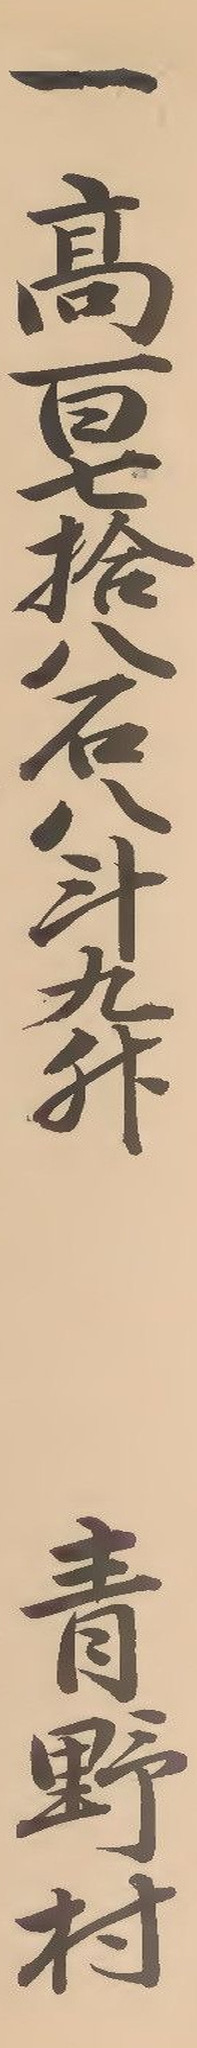一高百七拾八石八斗九升青野村
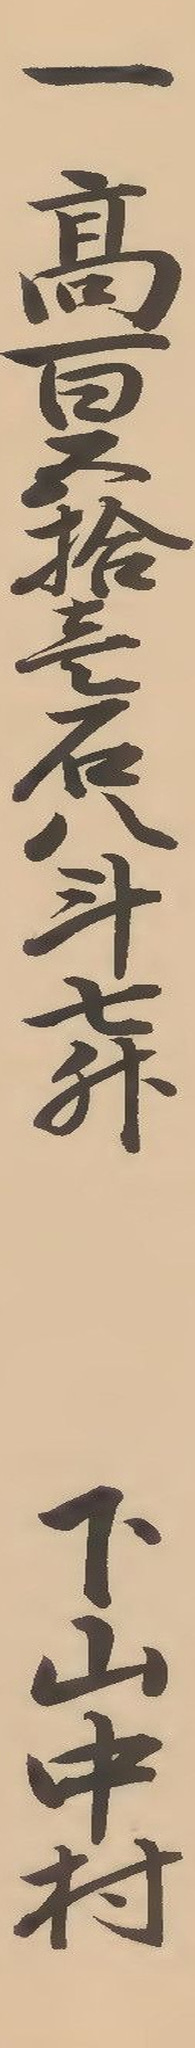一高百五拾壱石八斗七升下山中村
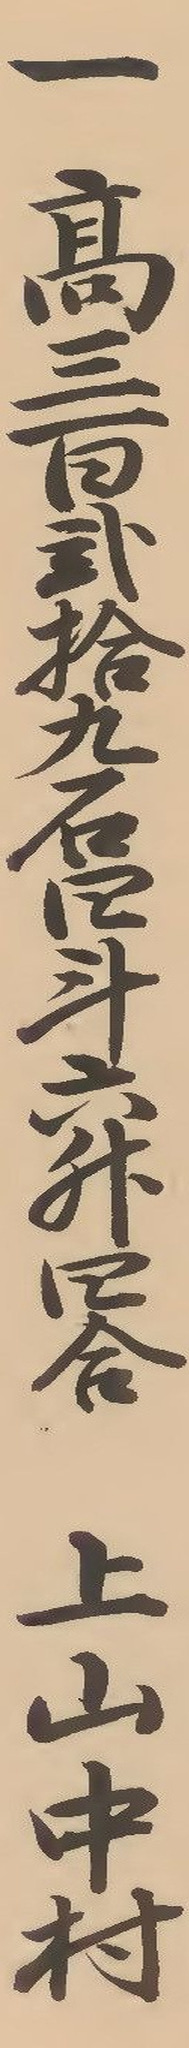一高三百弐拾九石四斗六升四合上山中村
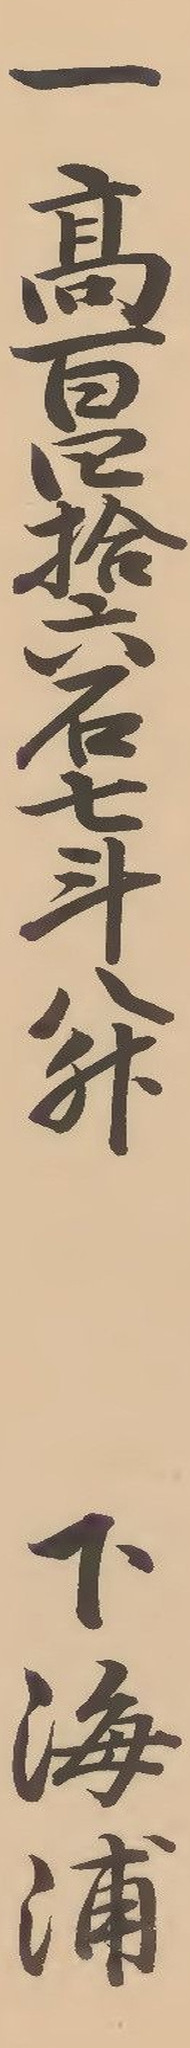一高百四拾六石七斗八升下海浦

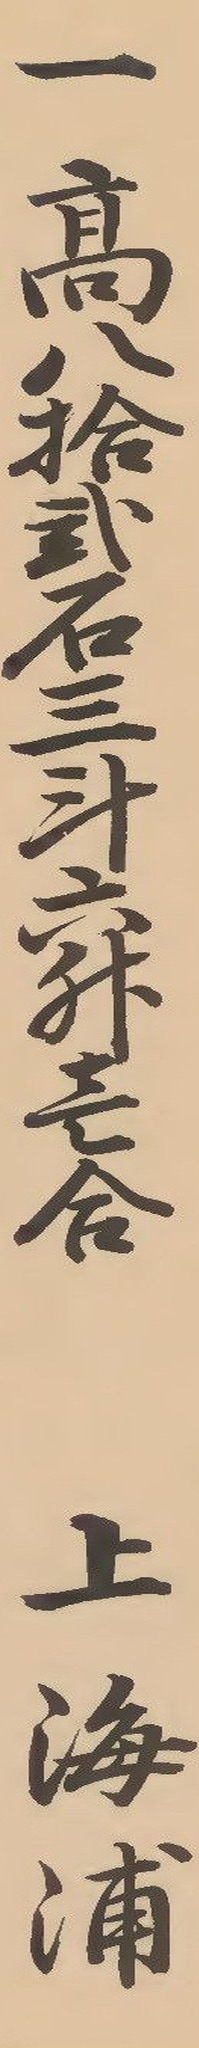一高八拾弐石三斗六升壱合上海浦
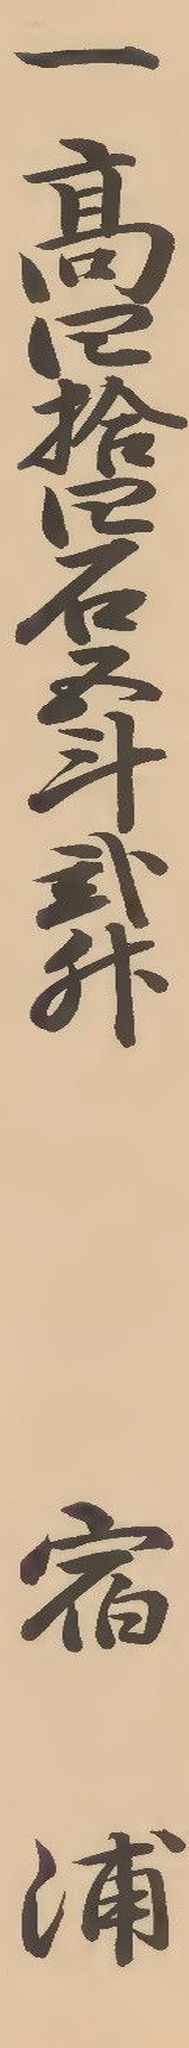一高四拾四石五斗弐升宿浦
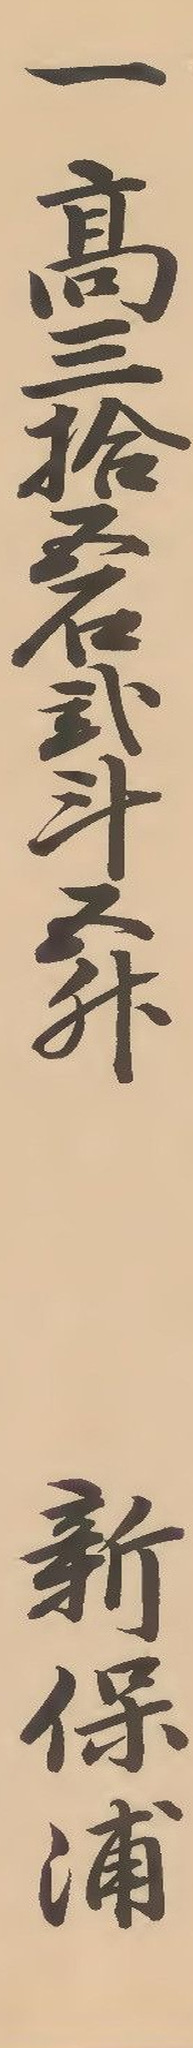一高三拾五石弐斗五升新保浦
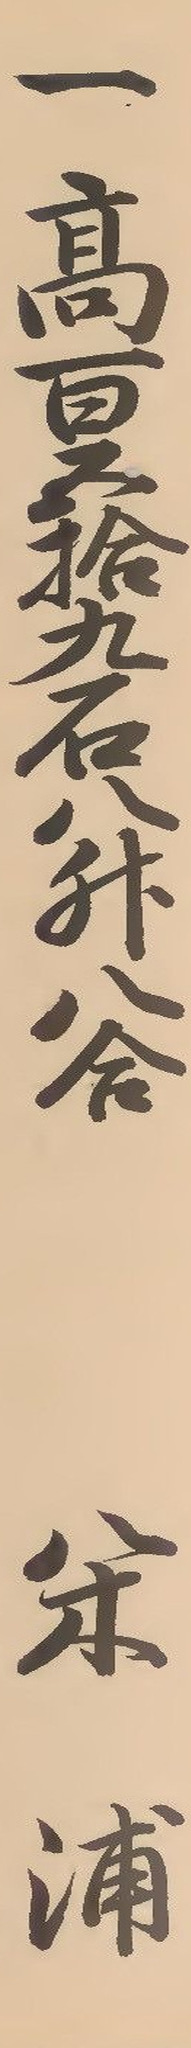一高百五拾九石八升八合米浦
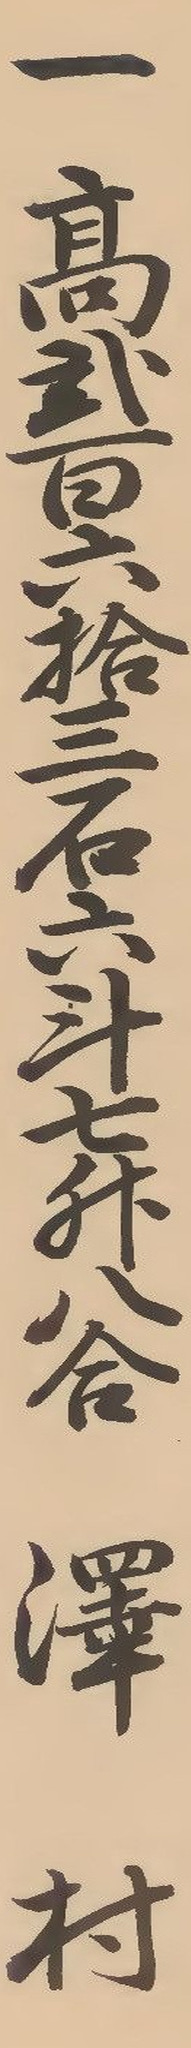一高弐百六拾三石六斗七升八合沢村
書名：越前国郷帳
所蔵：国立公文書館 National Archives of Japan
